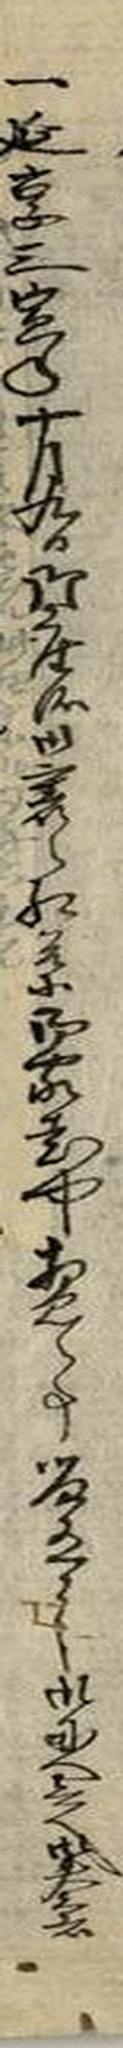一延享三寅年十月九日御座所御裏之紅葉御家老中拝見候事留有之御用人壱人御奏者
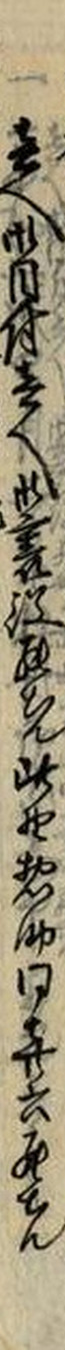壱人御目付壱人御裏役罷出ル此野惣助同喜六罷出ル
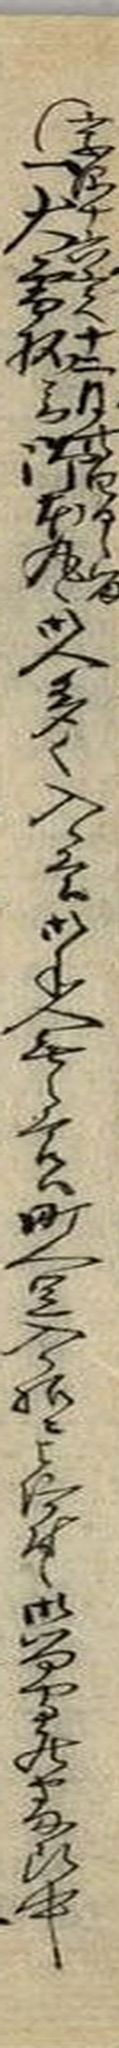一大雪抔にて御本丸へ御人多く入候節御手人無之節は町人足入候様と被仰付候御留守居番頭中
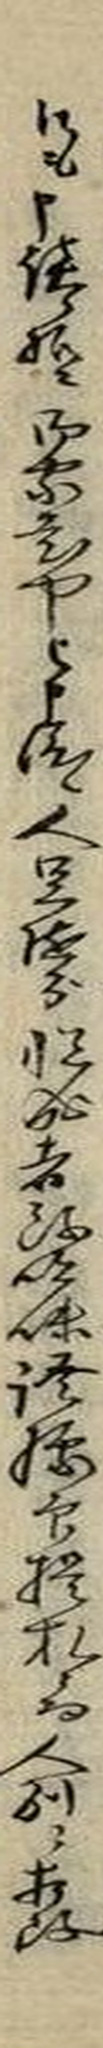えも申談候様に御家老中被申渡候人足随分慥成者致吟味証拠印提札にて人別に相改
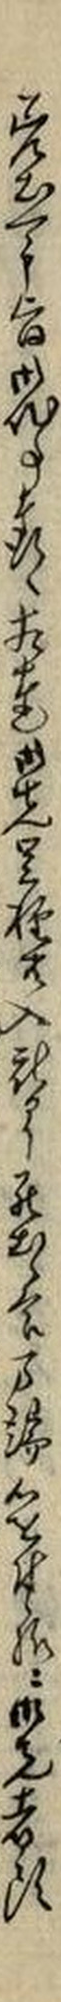差出可申旨御作事奉行へ相達御先足軽共入替り罷出候節万端心を付候様に御先者頭
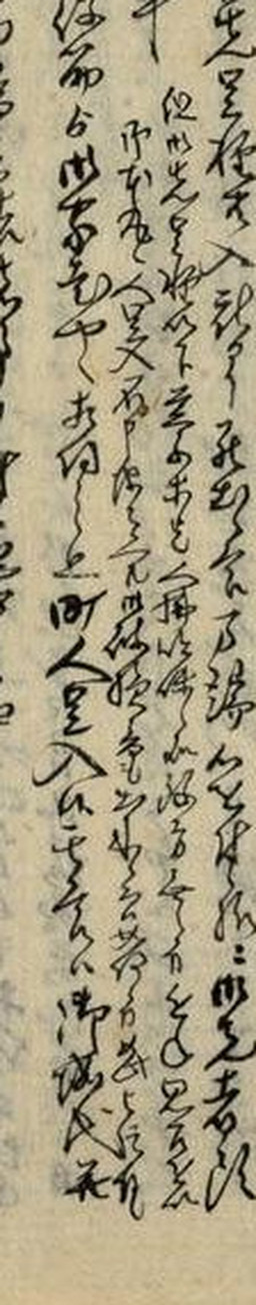御本丸へ人足入不申儀に候へ共御破損にても出来候ては如何に付如此被仰付候
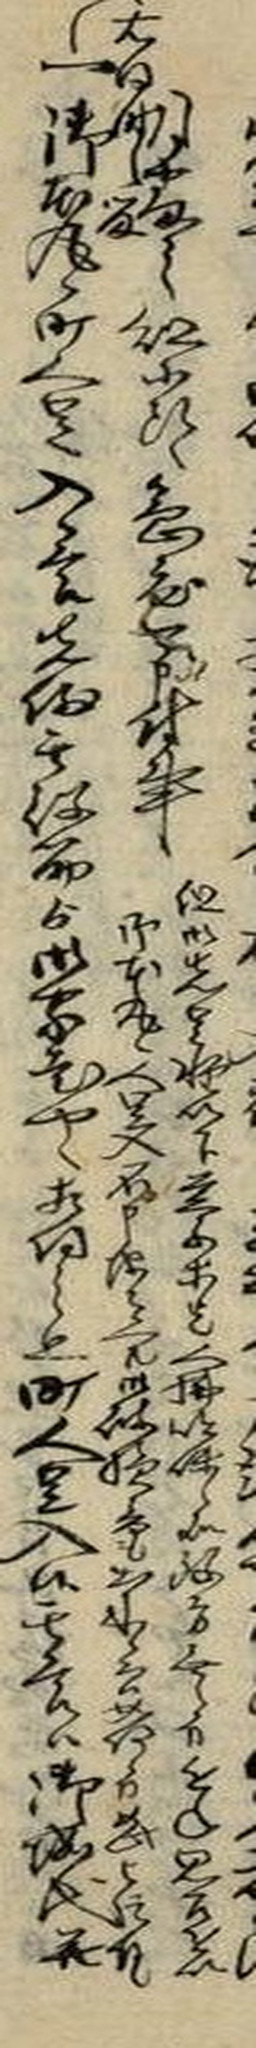一御本丸へ町人足入候節先例其役筋ゟ御家老中へ相伺之上町人足入候其節は御城代并
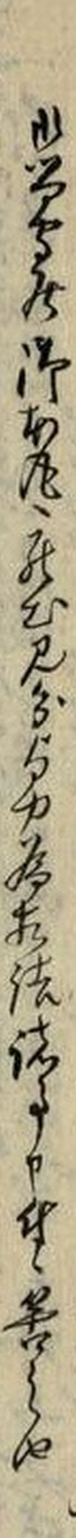御留守居御本丸へ罷出見分与力為相詰諸事申付候筈之由
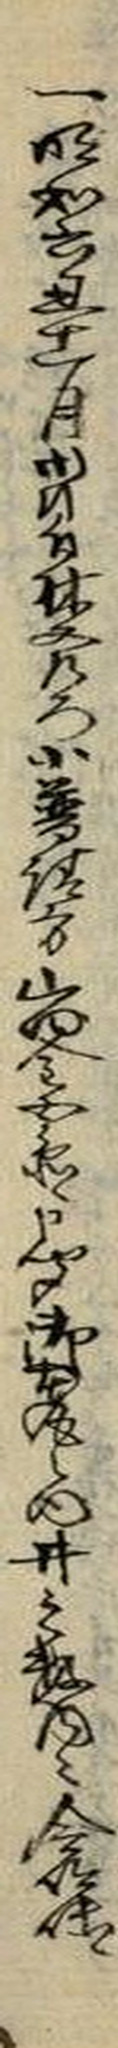一明和六丑十一月御目付林又左衛門小普請方山田金五兵衛へ申聞御本丸之内井之数内々令吟味候
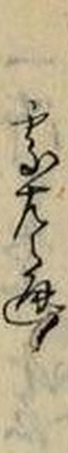処左之通
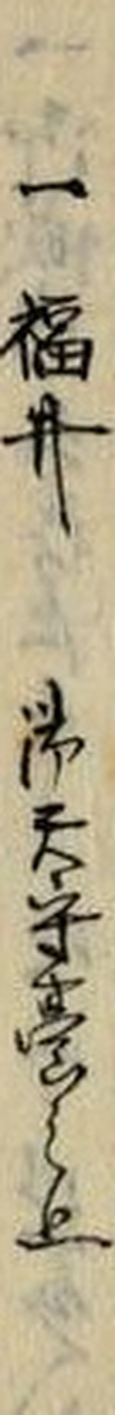一福井御天主台之上
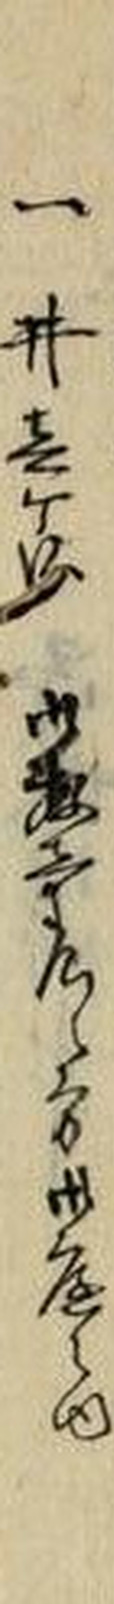一井壱ケ所御数寄屋之方御庭之内
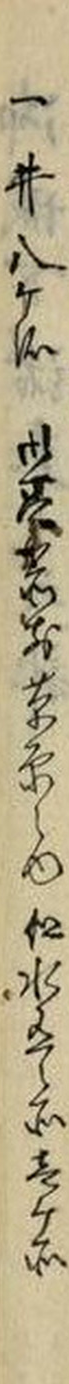一井八ケ所御台所前草原之内但水有之所壱ケ所
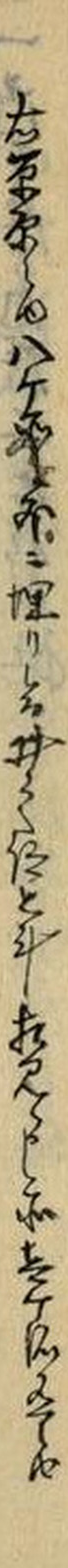右草原之内八ケ所之外に埋り候て井之跡と斗相見へ申候所壱ケ所有之由
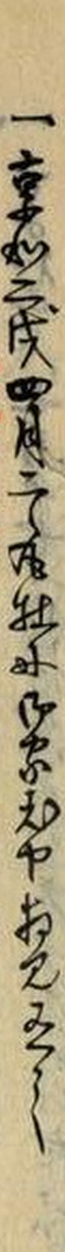一享和二戌四月二之丸牡丹御家老中拝見有之
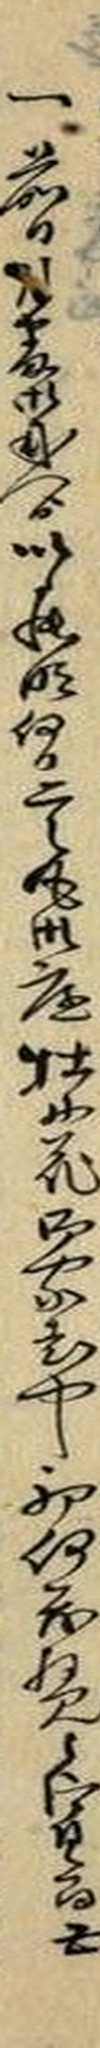一前日月番御用人ゟ以手紙明何日二之丸御庭牡丹花御家老中初何も拝見被仰付候間五
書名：御城下諸事之部
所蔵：福井県文書館 Fukui Prefectural Archives
